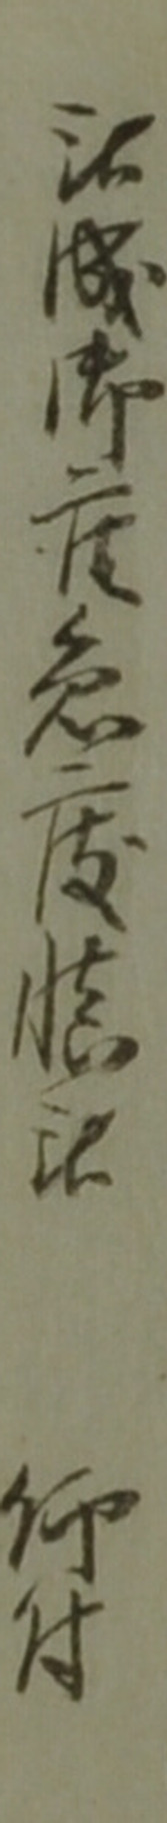被成御座急度慎被仰付
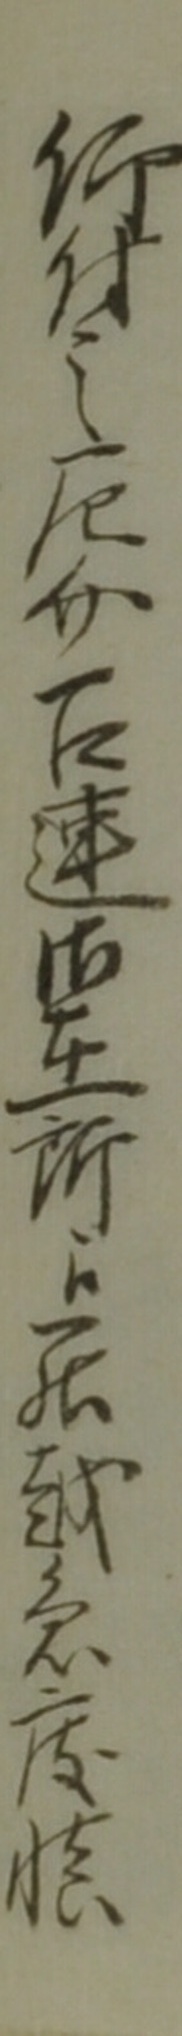仰付之厄介召連御在所江罷越急度慎
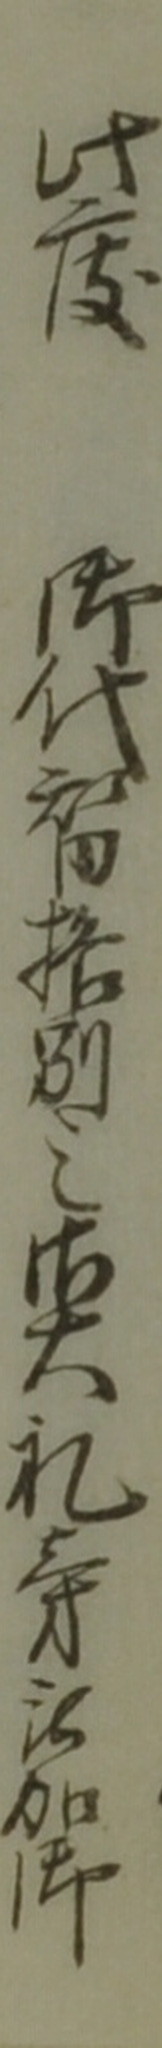此度御代替格別之御大礼旁被加御
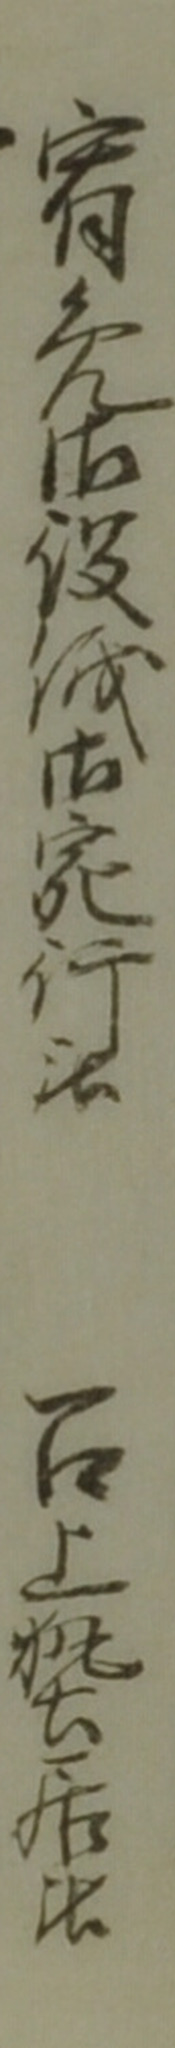宥免御役儀御宛行被召上蟄居被
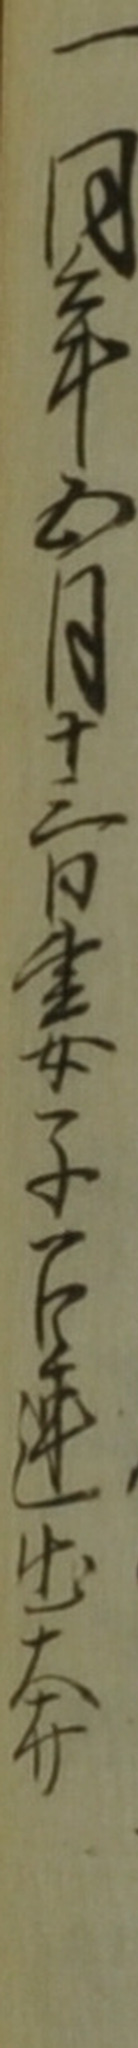一同年五月十三日妻子召連出奔
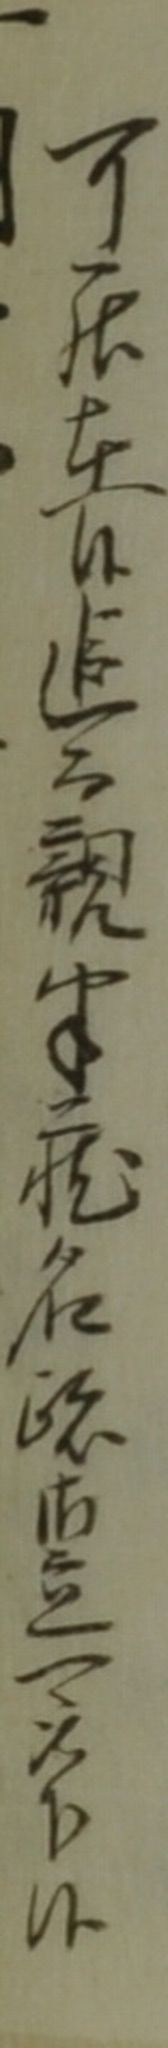可罷在候迄而親半蔵名跡御立可被下候
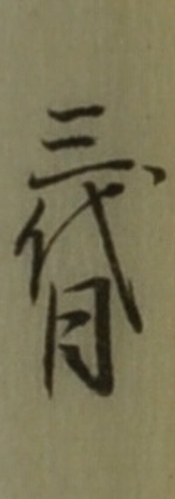三代目
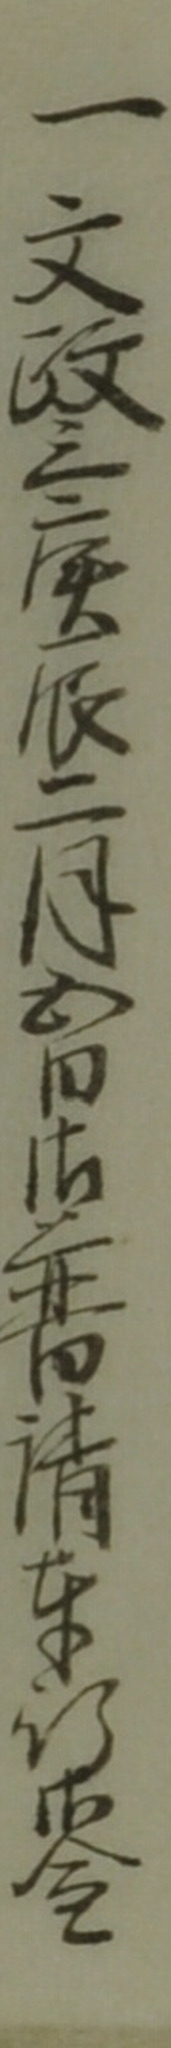一文政三庚辰二月五日御普請奉行御金
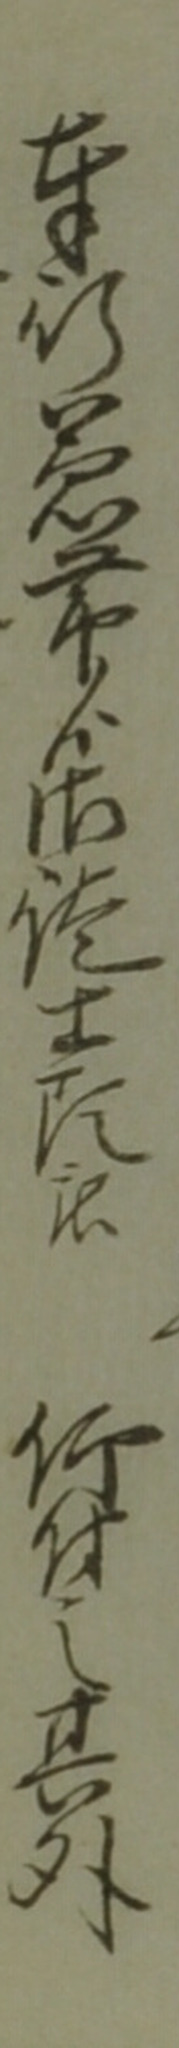奉行兼帯ゟ御徒士頭被仰付之其外
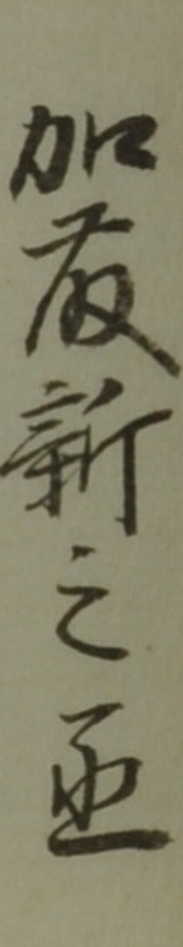加藤新之丞
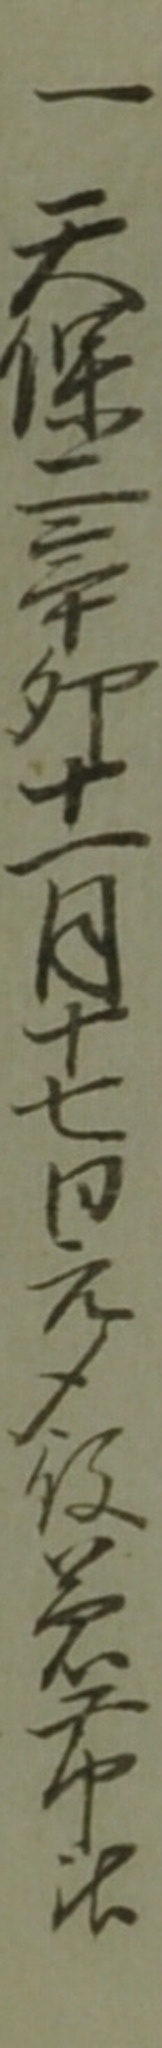一天保二辛卯十一月十七日元〆役兼帯被
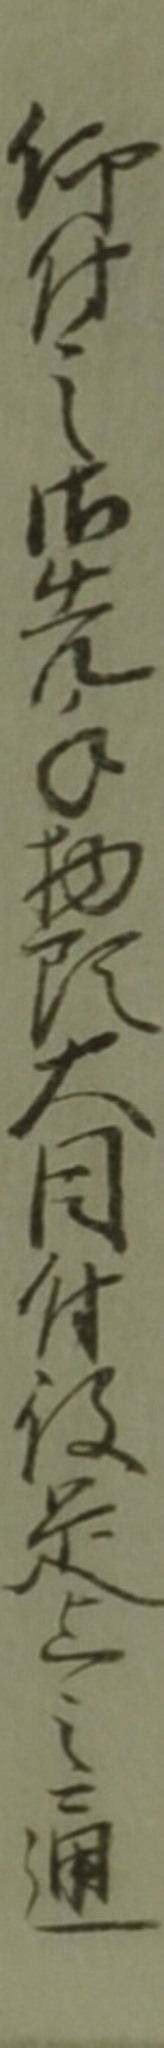仰付之御先手物頭大目付役是迄之通
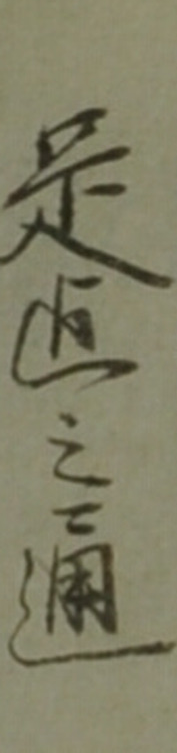是迄之通
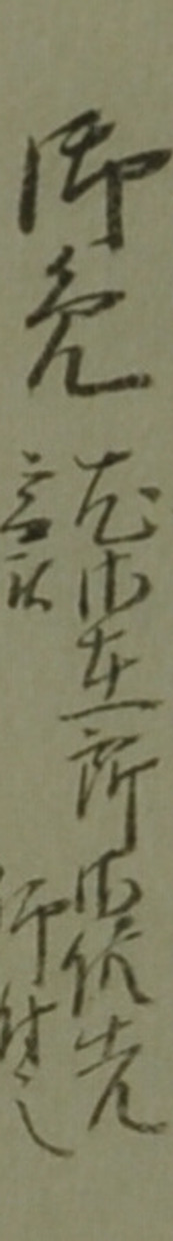御免尤御在所御供先
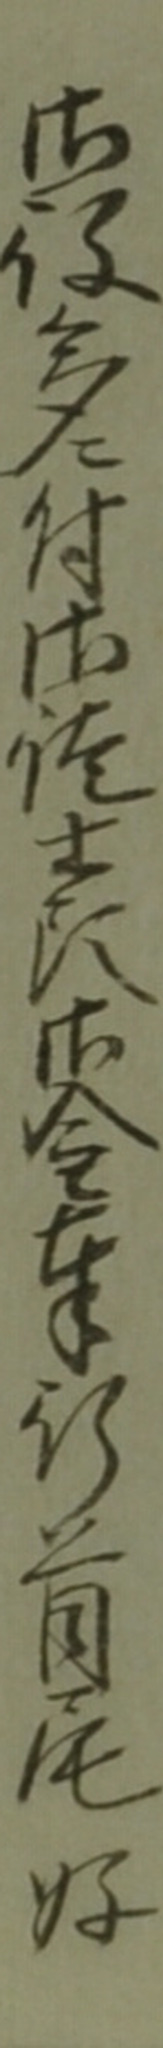御役多ニ付御徒士頭御金奉行首尾好
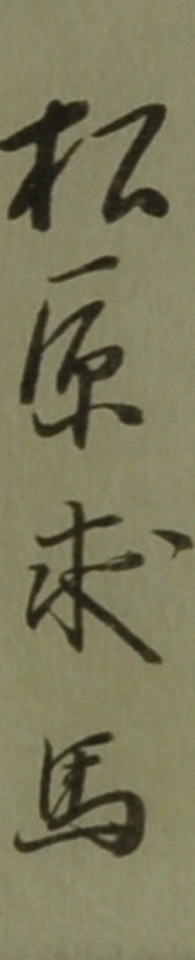松原求馬
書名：諸御役代々録（六）
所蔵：伊那市立高遠町図書館・合同会社AMANE
